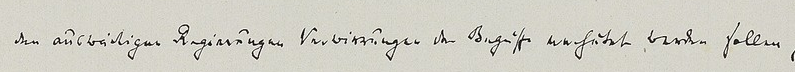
den auswärtigen Regierungen Verwirrungen der Begriffe verhütet werden sollen,
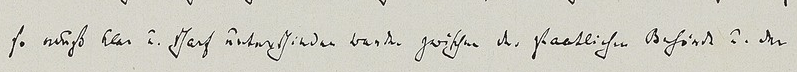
so muß klar u. scharf unterschieden werden zwischen der staatlichen Behörde u. der
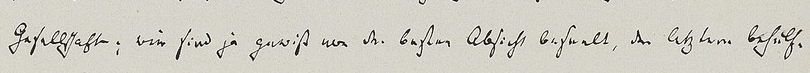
Gesellschaft; wir sind ja gewiß von der besten Absicht beseelt, der letztern behülf-
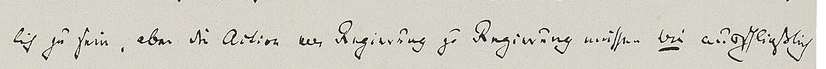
lich zu sein, aber die Action von Regierung zu Regierung müssen wir ausschließlich
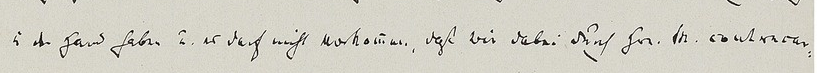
in der Hand haben u. es darf nicht vorkommen, daß wir dabei durch Hrn. M. contrecar-
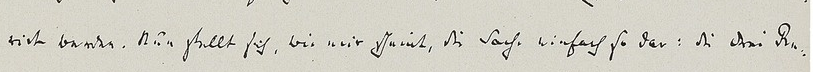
rirt werden. Nun stellt sich, wie mir scheint, die Sache einfach so dar: die drei Re-
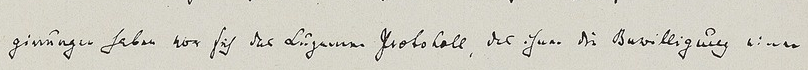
gierungen haben vor sich das Luzerner Protokoll, das ihnen die Bewilligung einer
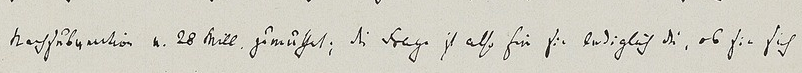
Nachsubvention v. 28 Mill. zumuthet; die Frage ist also für sie lediglich die, ob sie sich
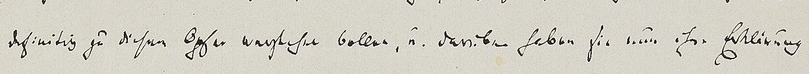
definitiv zu diesem Opfer verstehen wollen, u. darüber haben sie nun ihre Erklärung
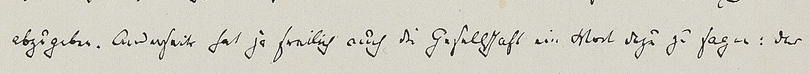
abzugeben. Anderseits hat ja freilich auch die Gesellschaft ein Wort dazu zu sagen: das
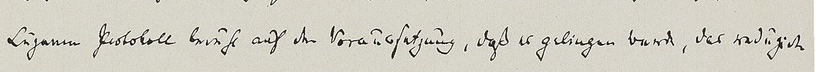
Luzerner Protokoll beruht auf der Voraussetzung, daß es gelingen werde, das reduzirte
